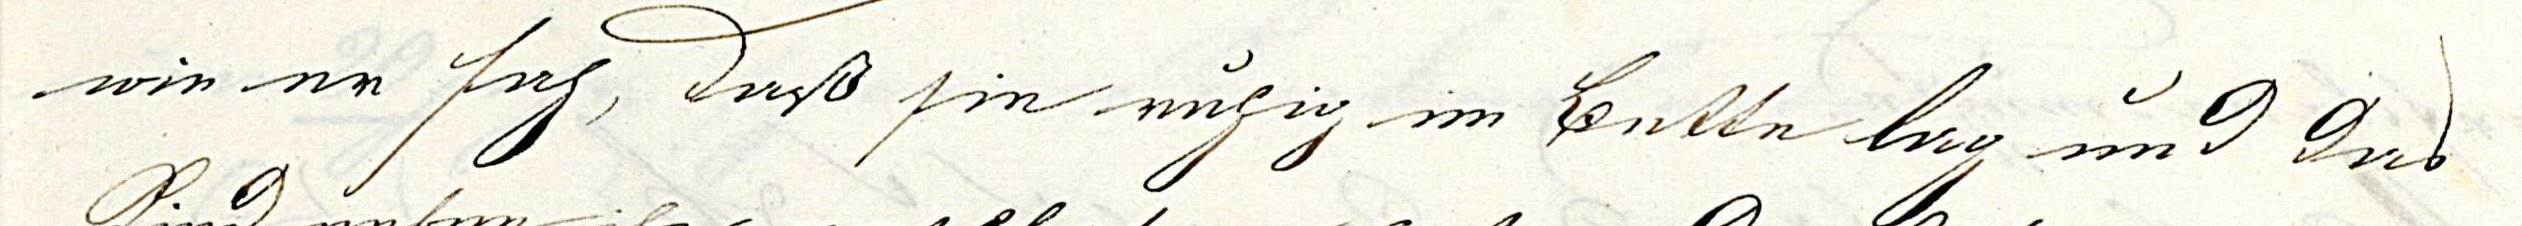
wie er sah, daß sie ruhig im Bette lag und das
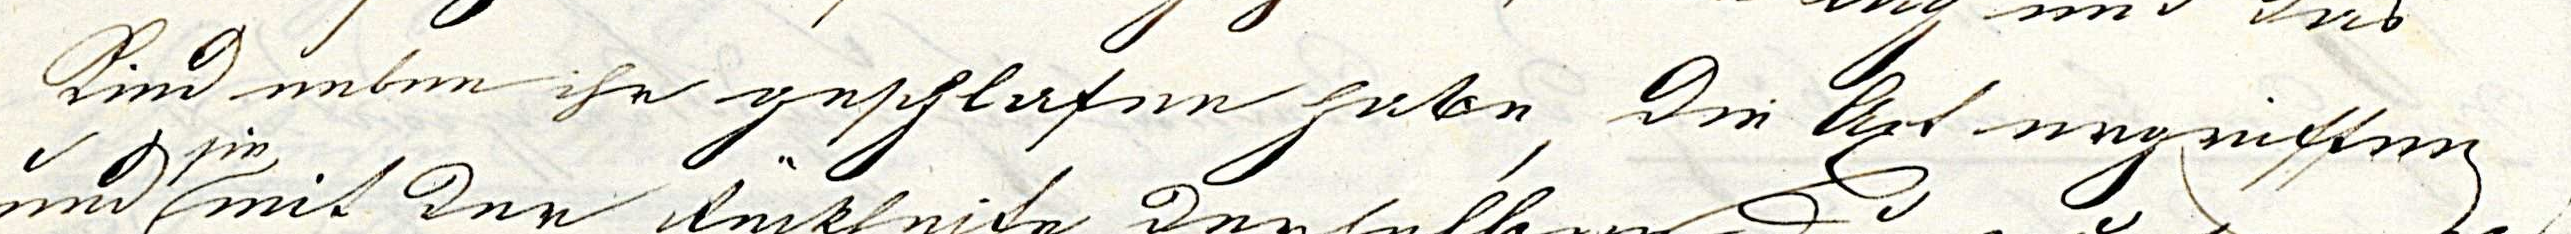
Kind neben ihr geschlafen habe, die Axt ergriffen
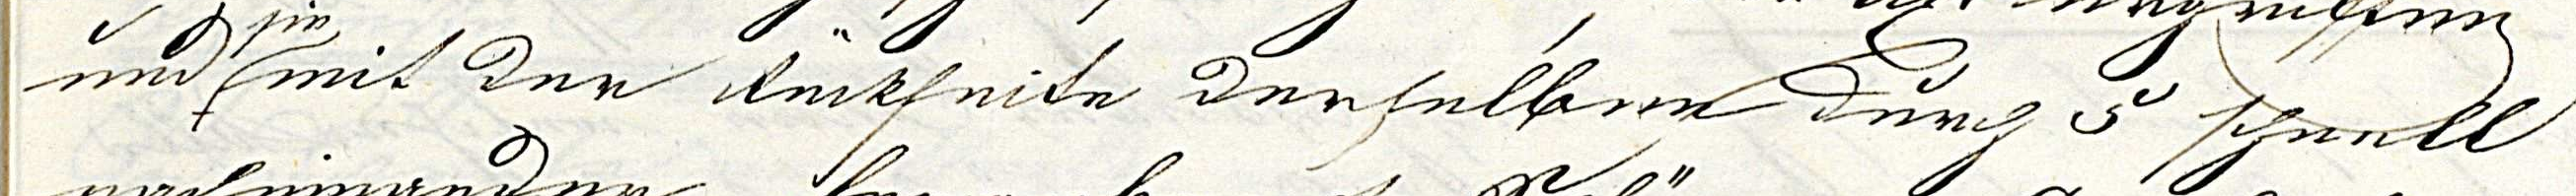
und sie mit der Rückseite derselben durch 5 schnell
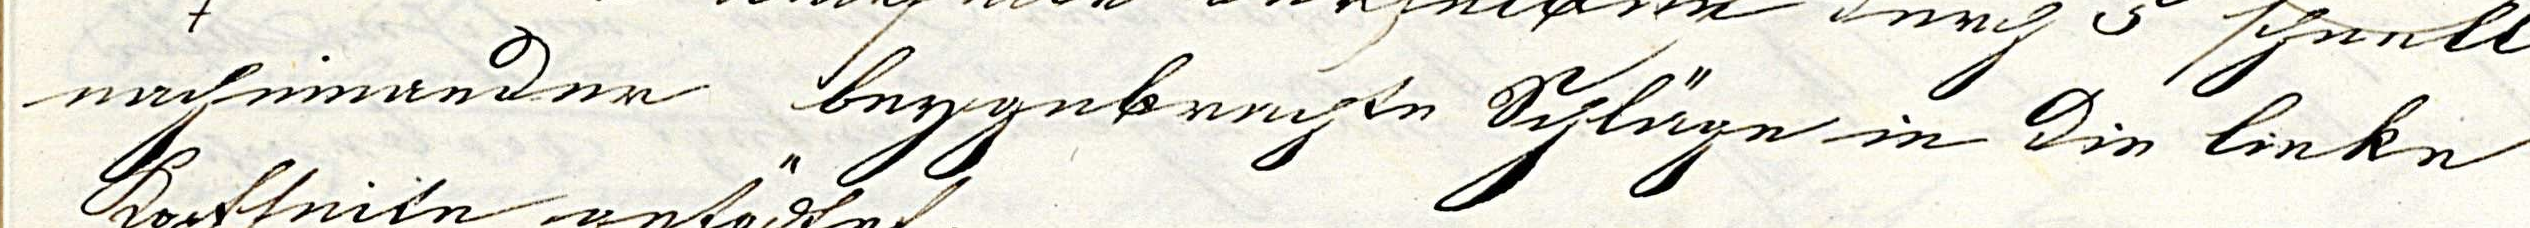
nacheinander beygebrachte Schläge in die linke
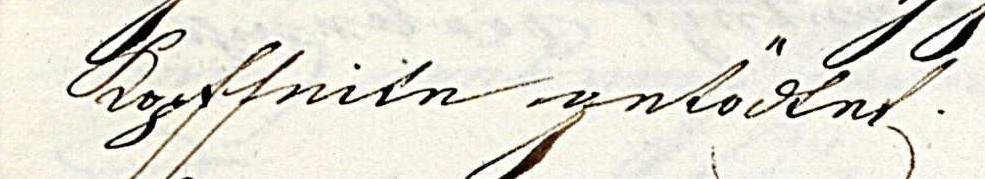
Kopfseite getödtet.
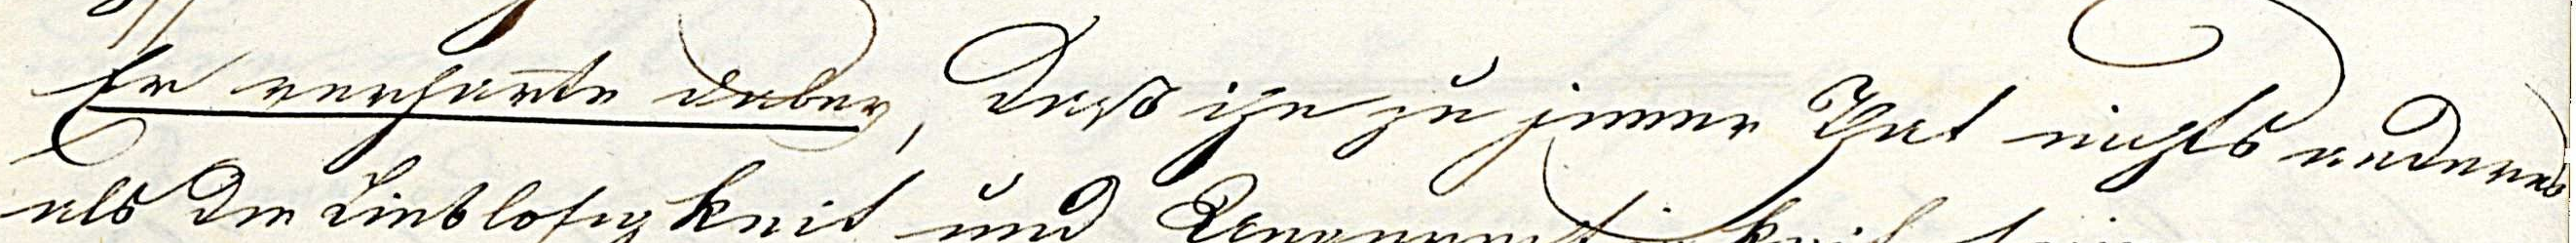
Er verharrte dabey, daß ihn zu jener That nichts anderes
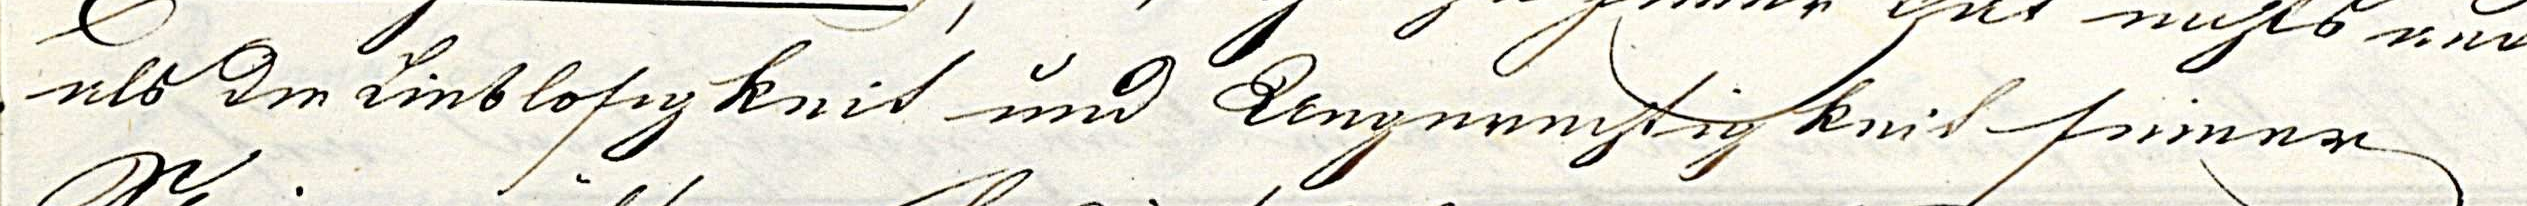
als die Lieblosigkeit und Ungerechtigkeit seiner
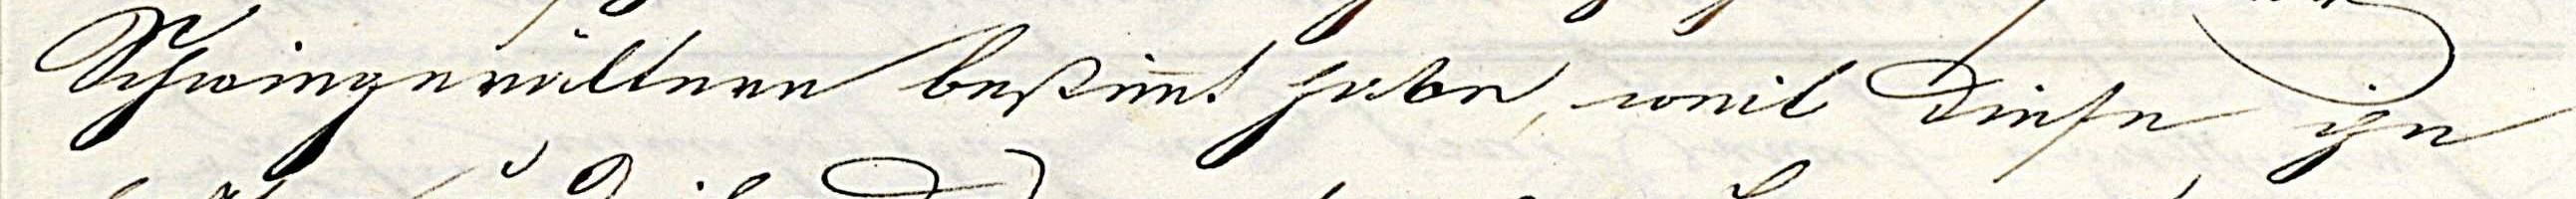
Schwiegerältern bestimmt habe, weil diese ihn
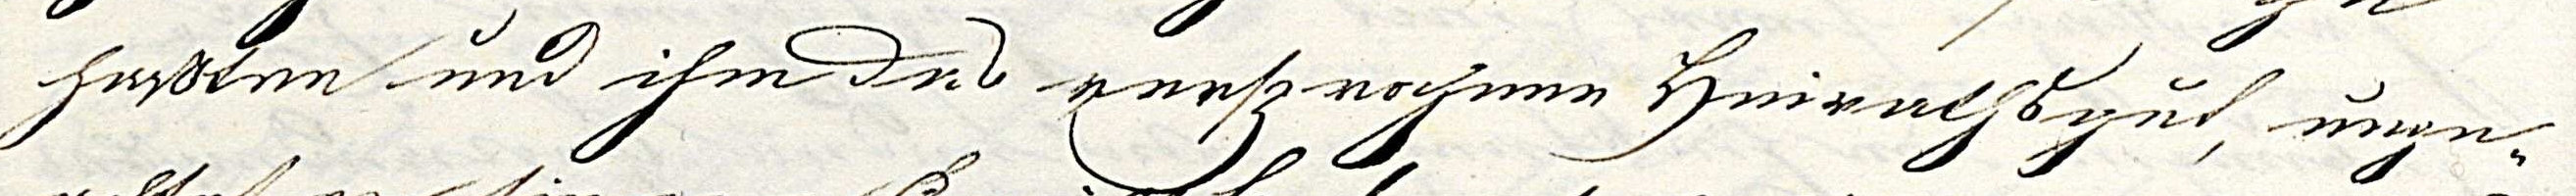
haßten und ihm das versprochene Heirathsgut, unge¬
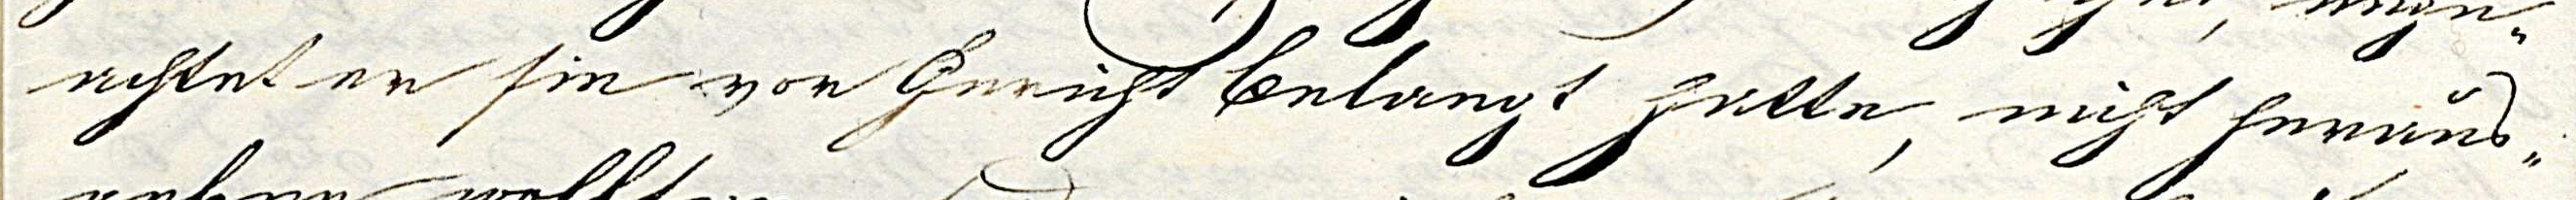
achtet er sie vor Gericht belangt hatte, nicht heraus¬
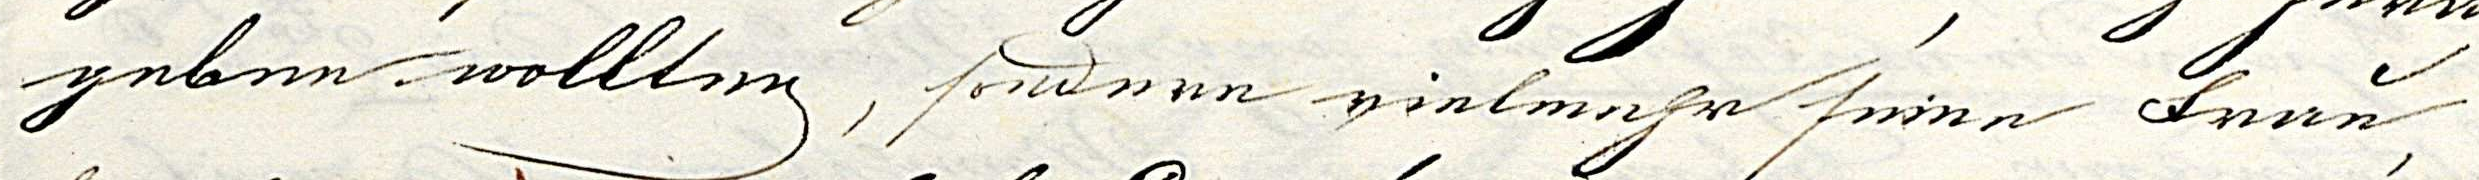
geben wollten, sondern vielmehr seine Frau,
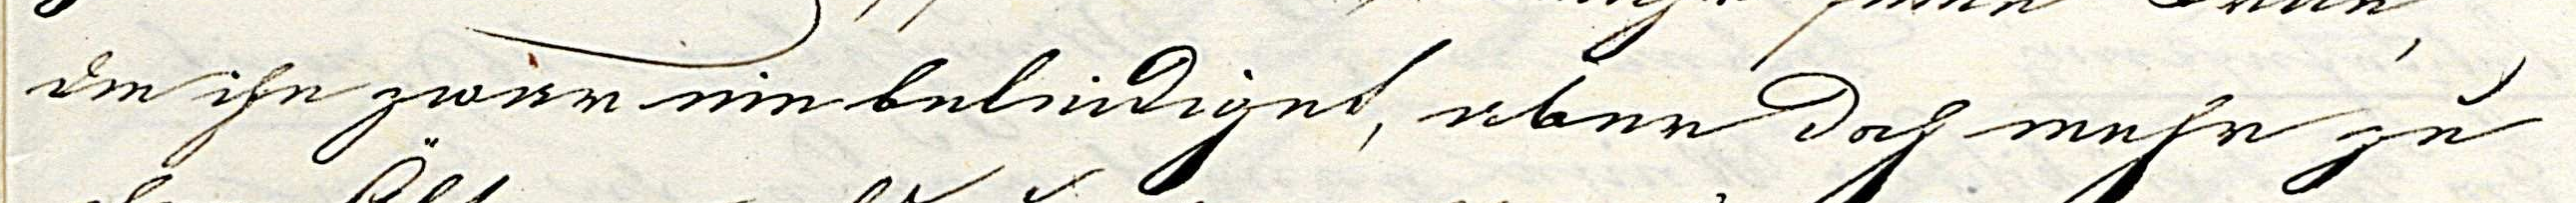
den ihn zwar nie beleideigt, aber doch mehr zu
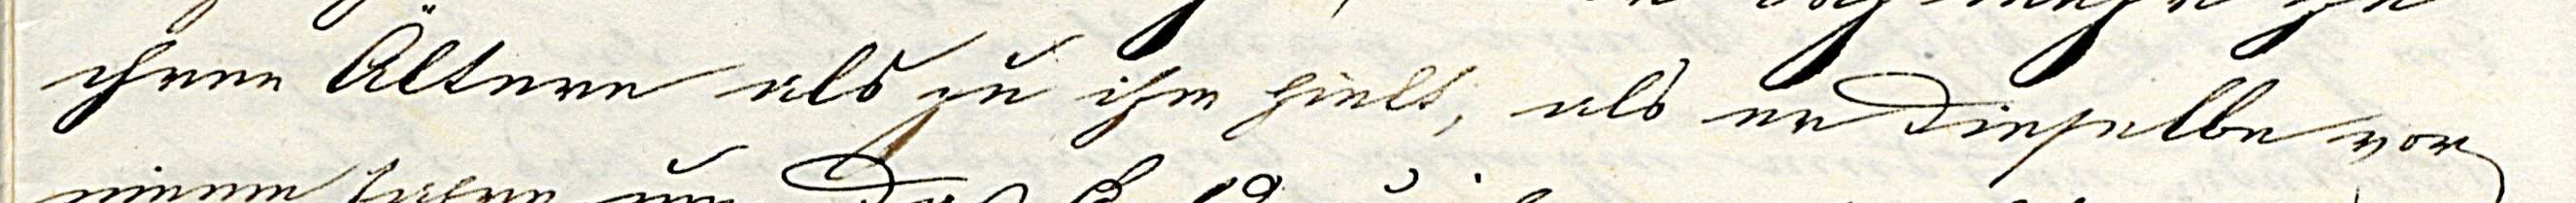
ihren Ältern als zu ihm hielt, als er dieselbe vor
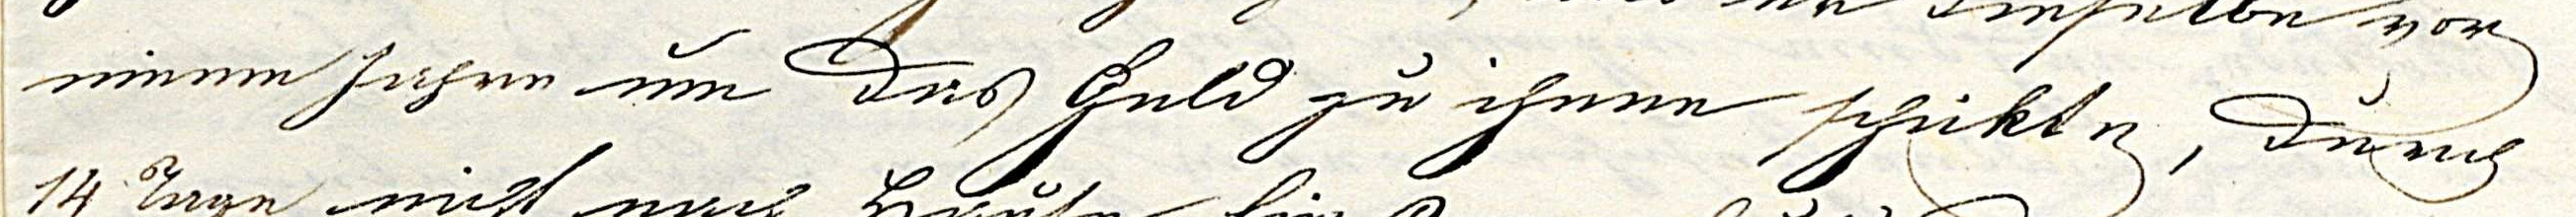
einem Jahre um das Geld zu ihnen schikte, durch
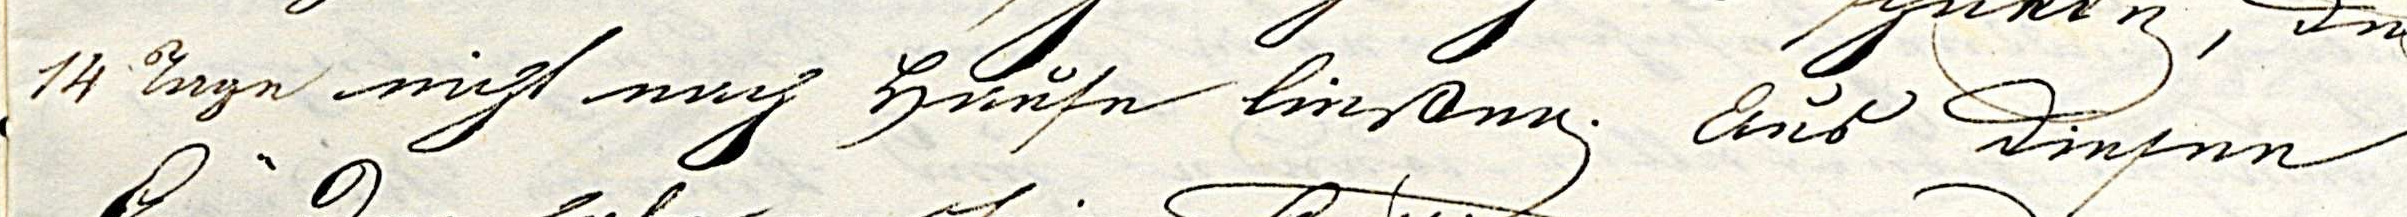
14 Tage nicht nach Hause ließen. Aus diesen
